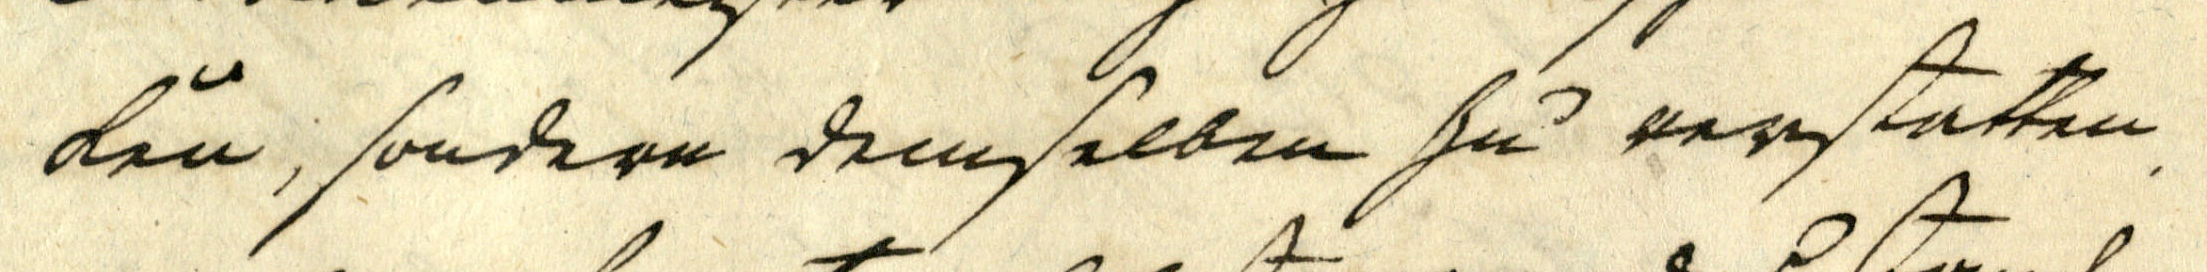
ken, sondern demselben zu verstatten,
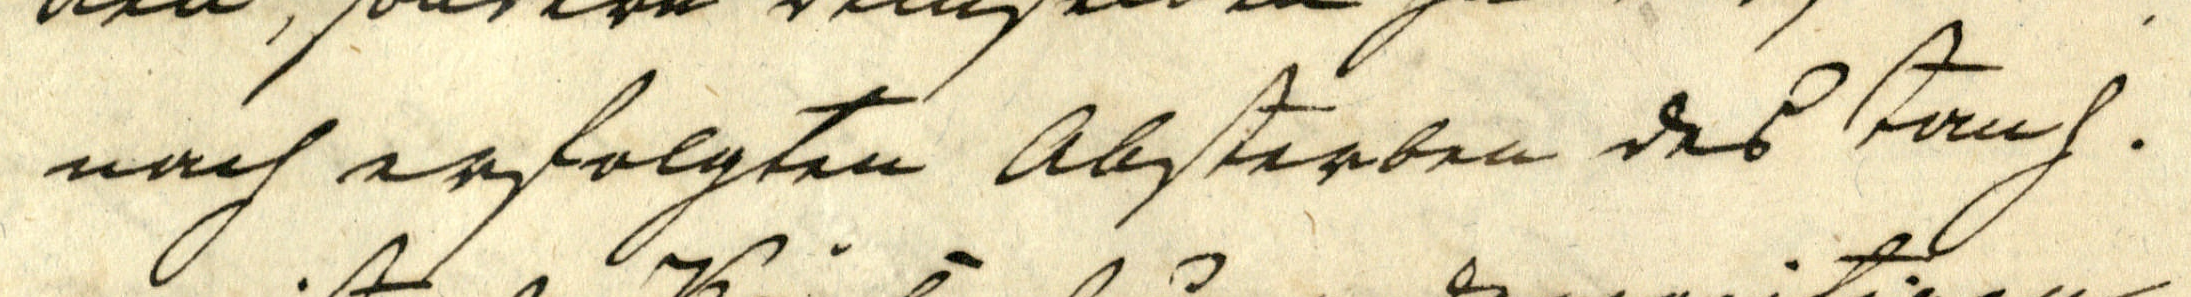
nach erfolgten Absterben des Tanz¬
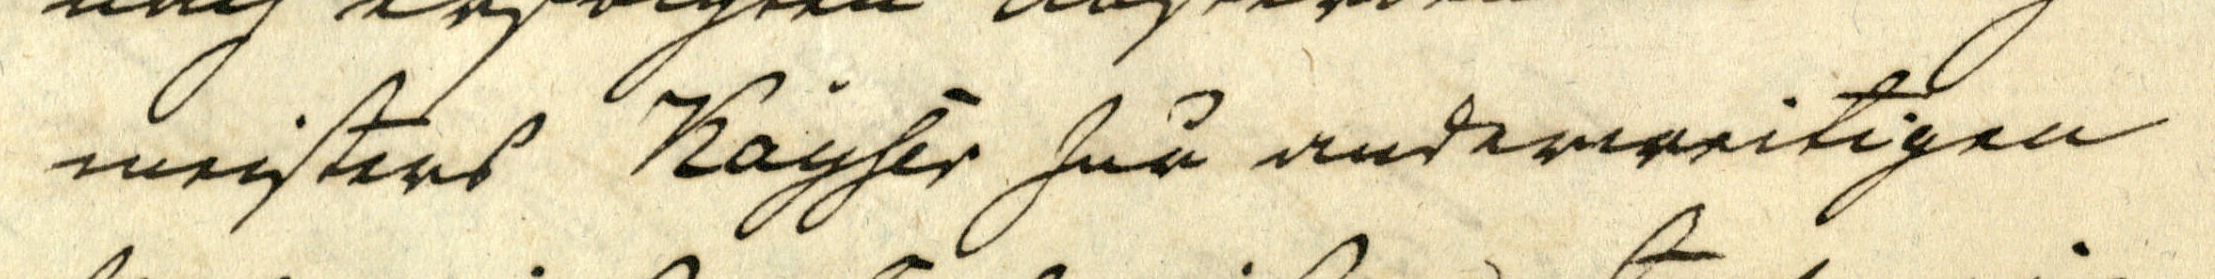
meisters Kaÿser zur anderweitigen
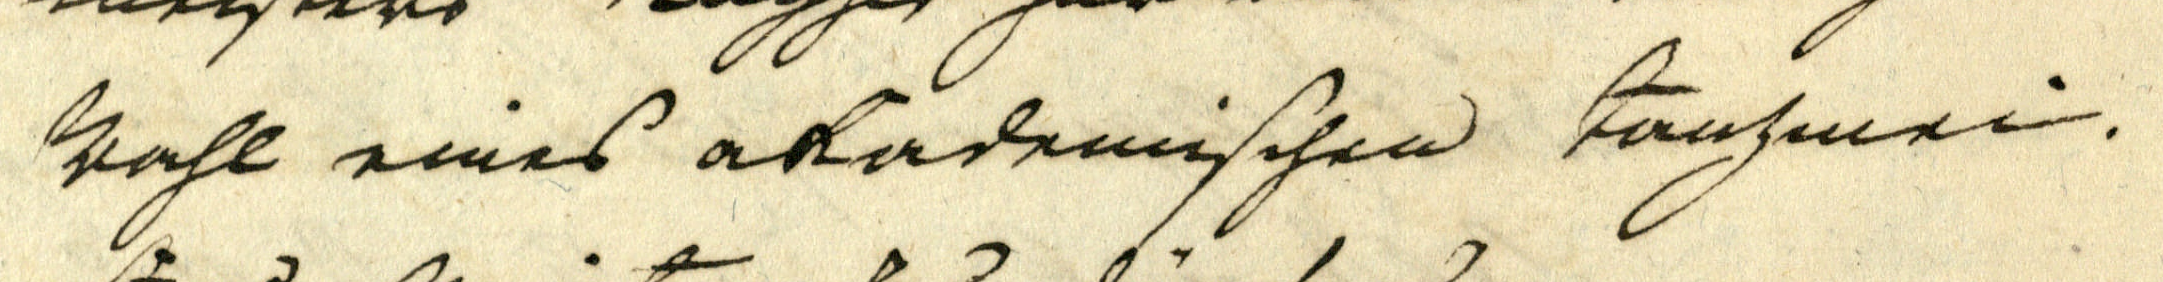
Wahl eines akademischen Tanzmei¬
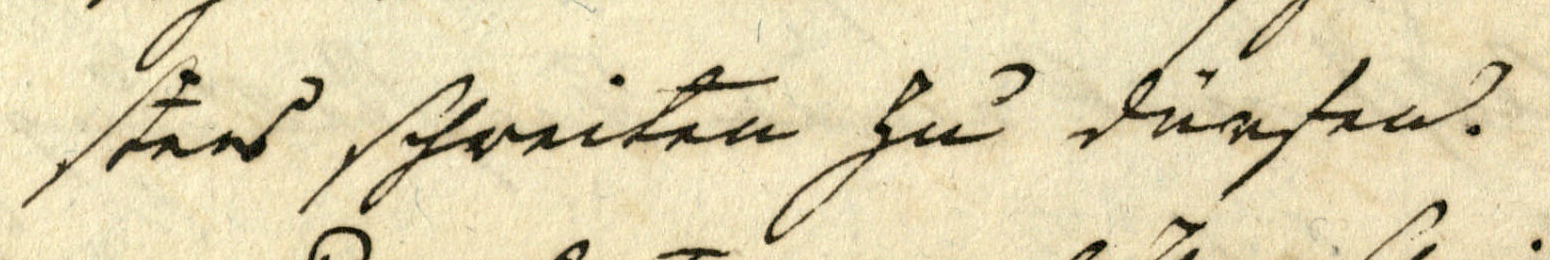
sters schreiten zu dürfen.
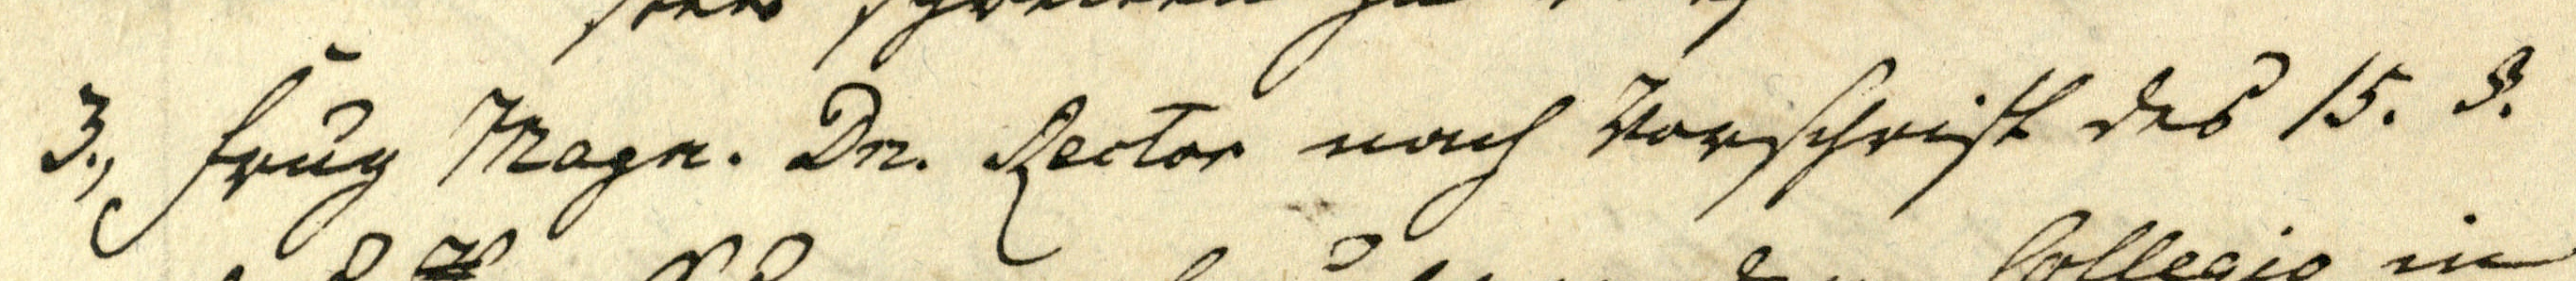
3. frug Magn. Dn. Rector nach Vorschrift des 15. §.
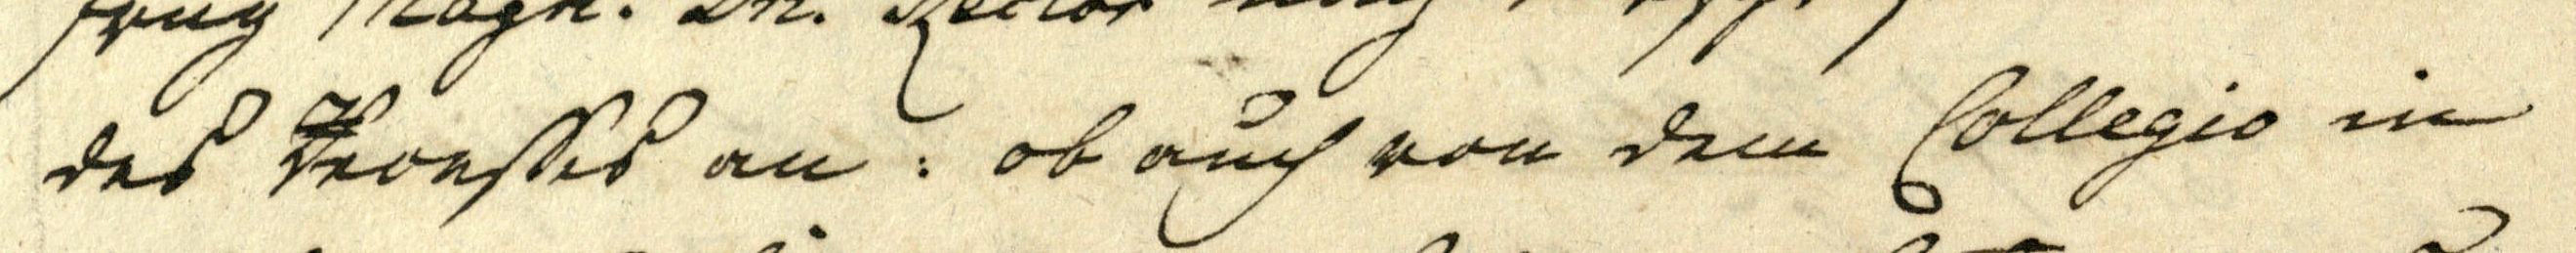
des Recesses an: ob auch von dem Collegio in
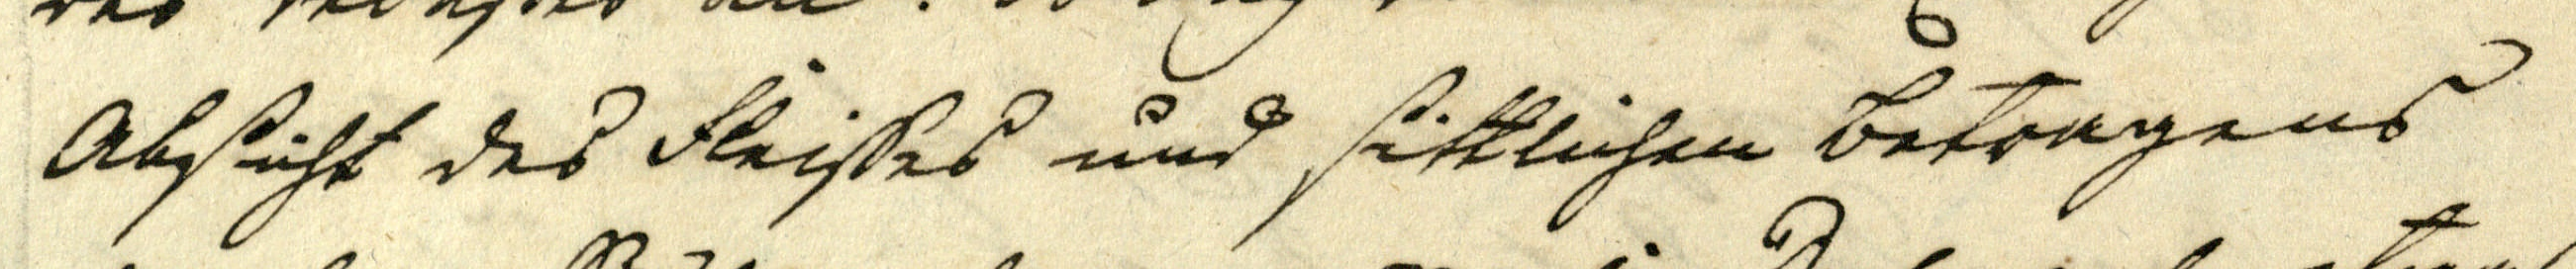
Absicht des Fleisses und sittlichen Betragens
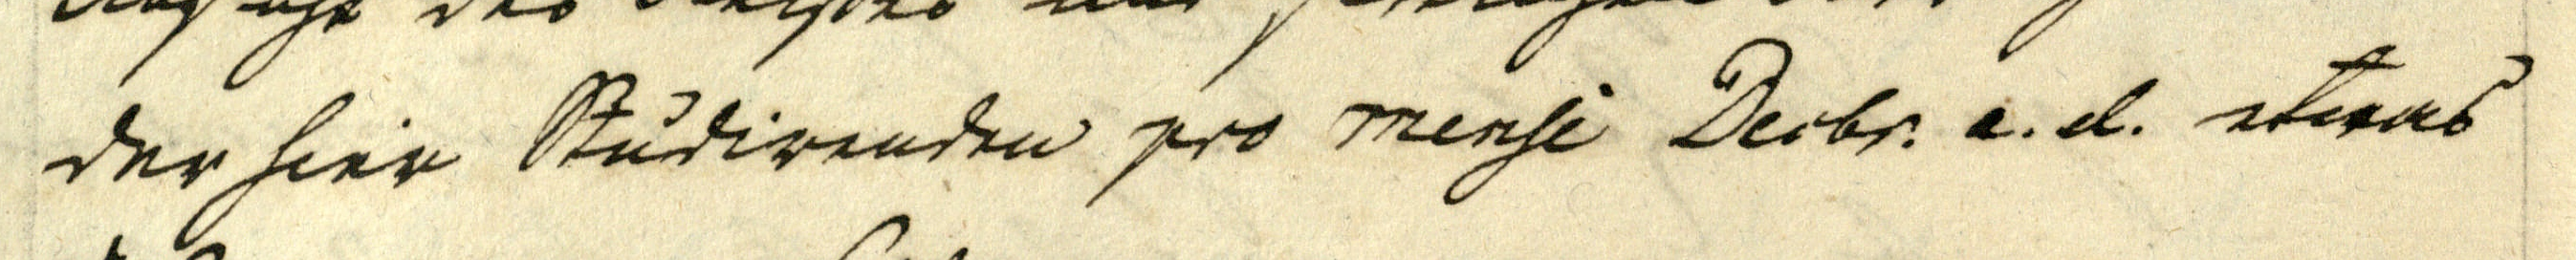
der hier Studirenden pro mense Decbr a. et. etwas
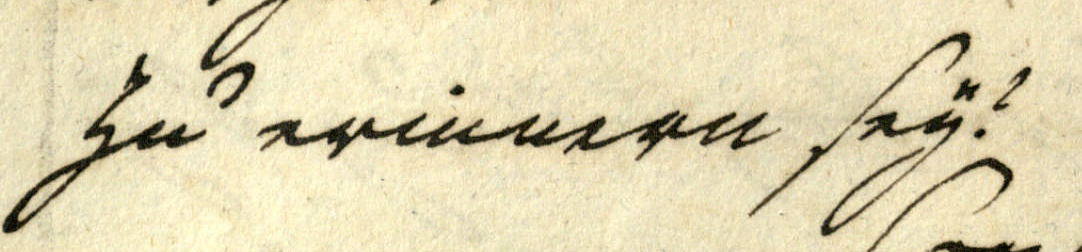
zu erinnern seÿ?
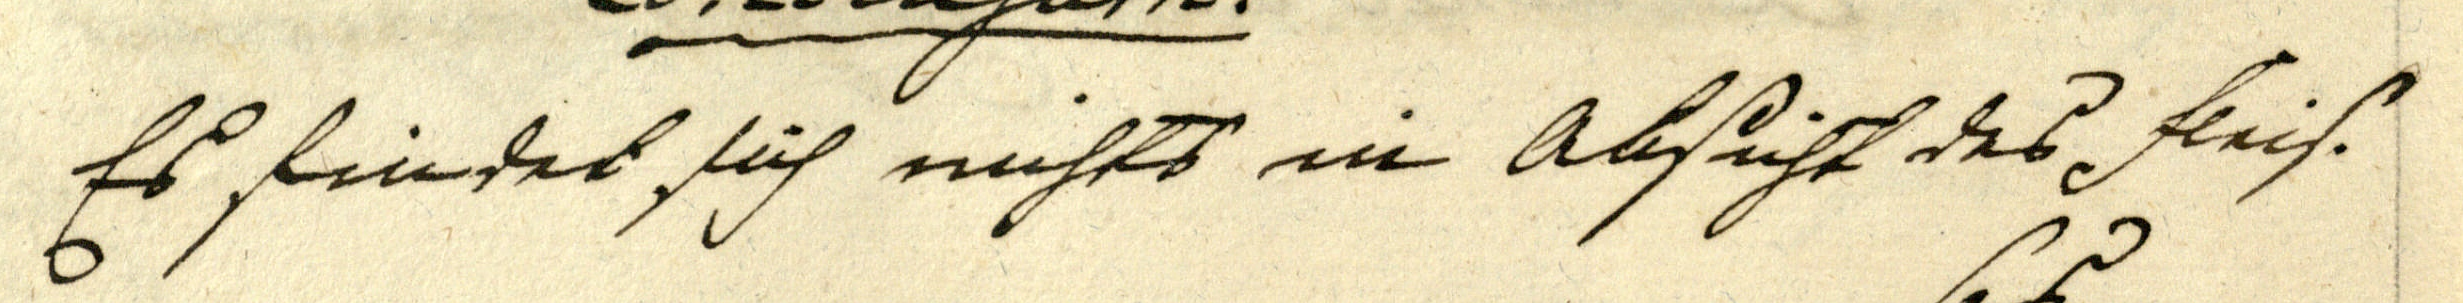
Es findet sich nichts in Absicht des Fleis¬
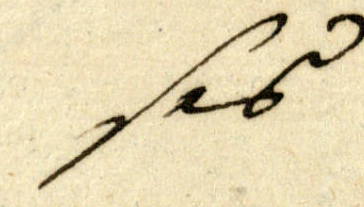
ses
